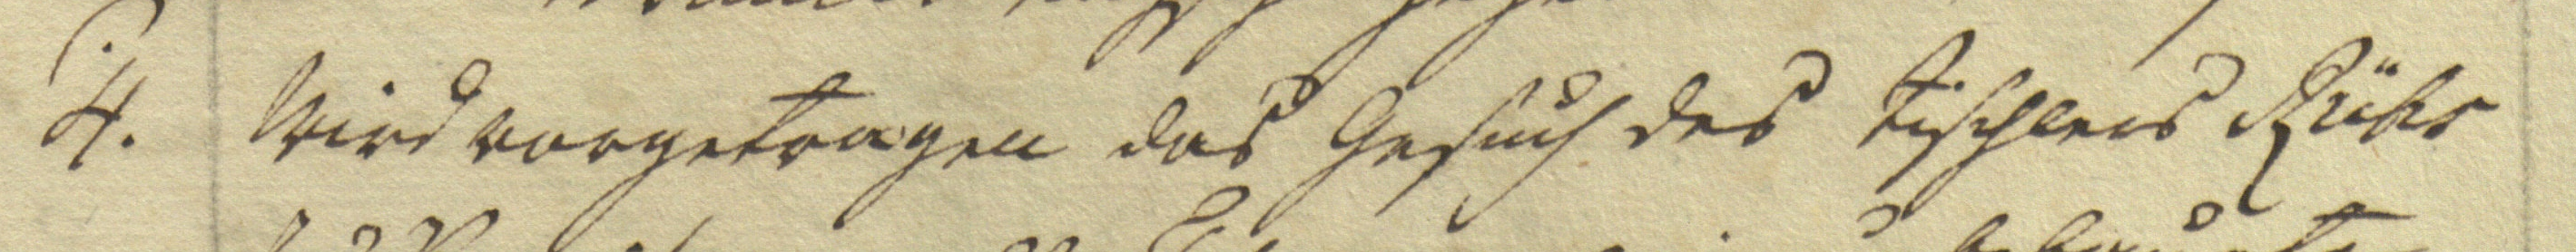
4. Wird vorgetragen das Gesuch des Tischlers Rühs
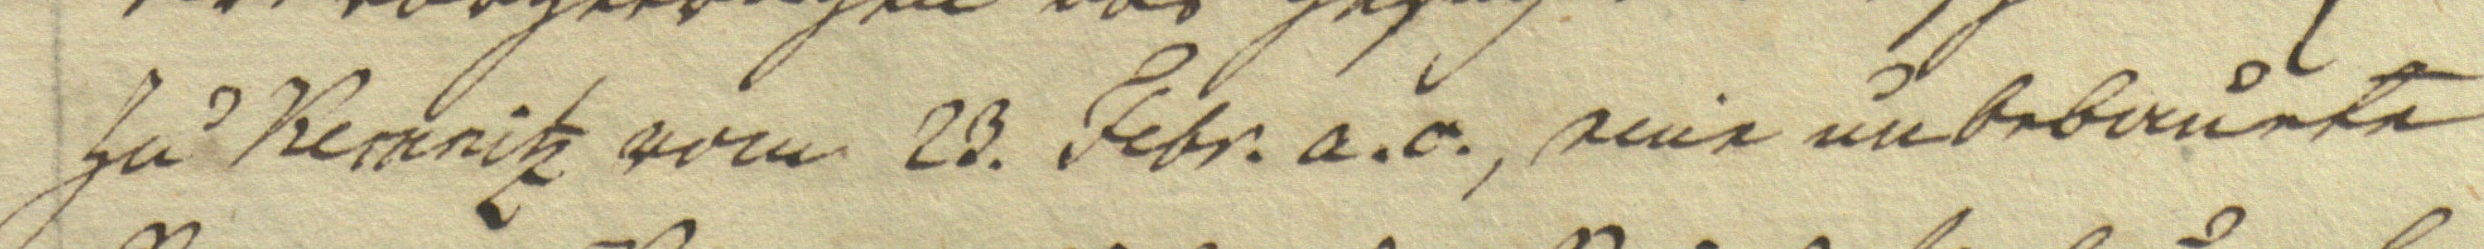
zu Kemnitz vom 23. Febr. a. c., eine unbebauete
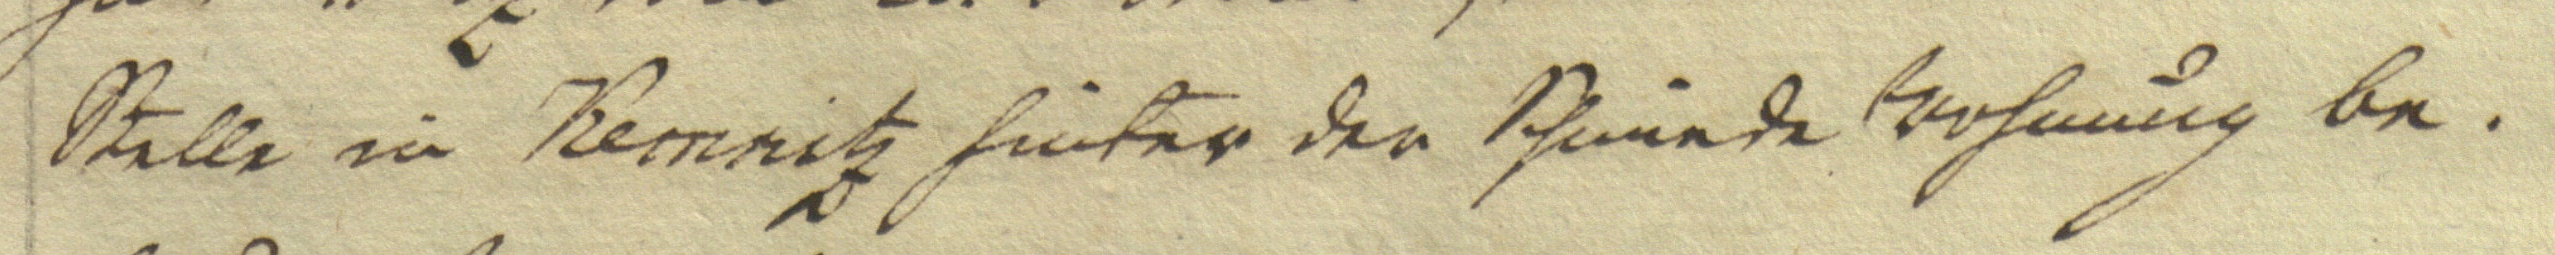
Stelle in Kemnitz hinter der Schmiede Wohnung be¬
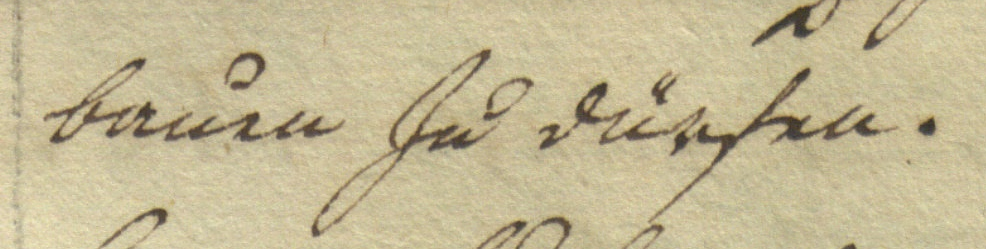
bauen zu dürfen.
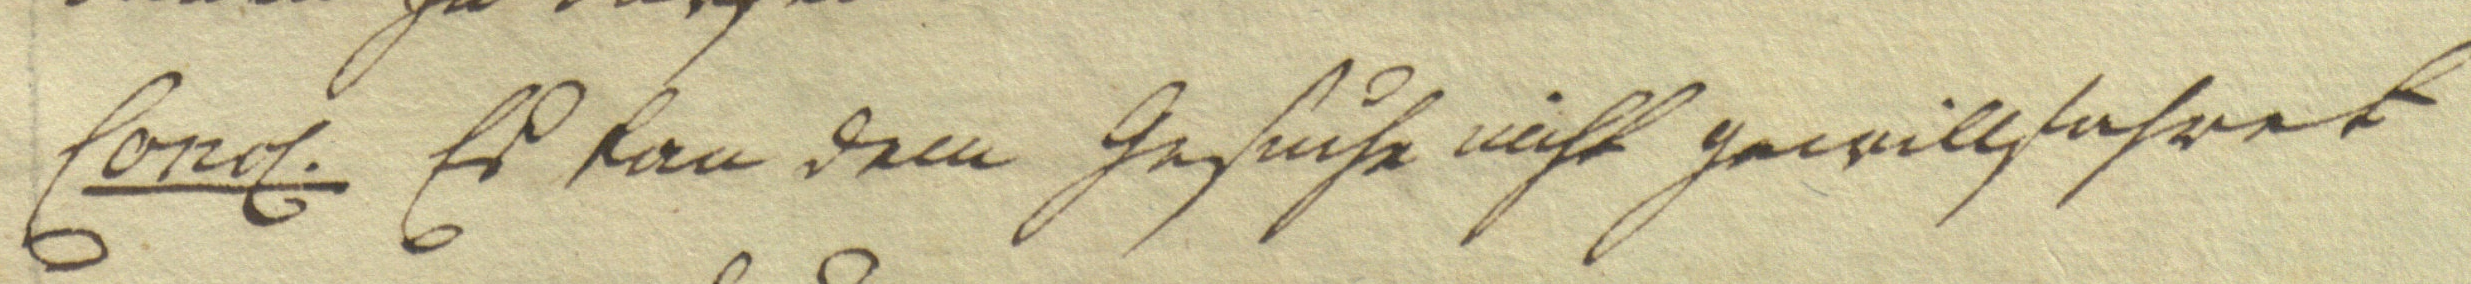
Concl. Es von dem Gesuche nicht gewillfahret
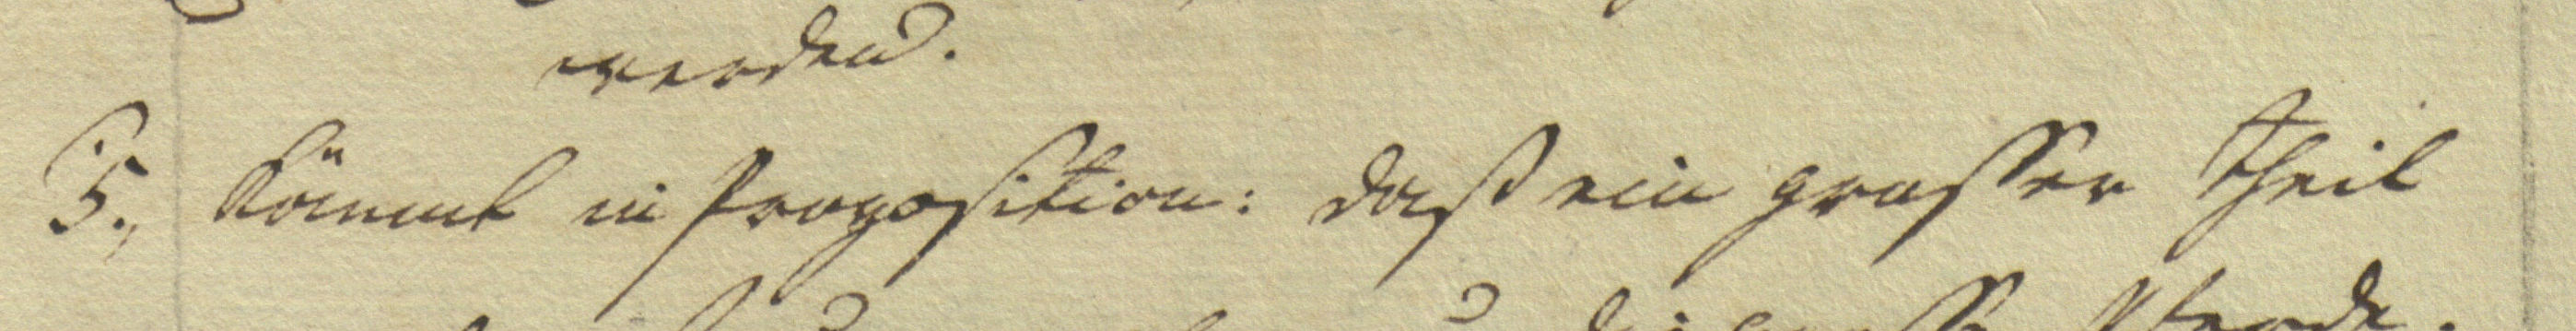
5. Kömmt in Proposition: daß ein grosser Theil
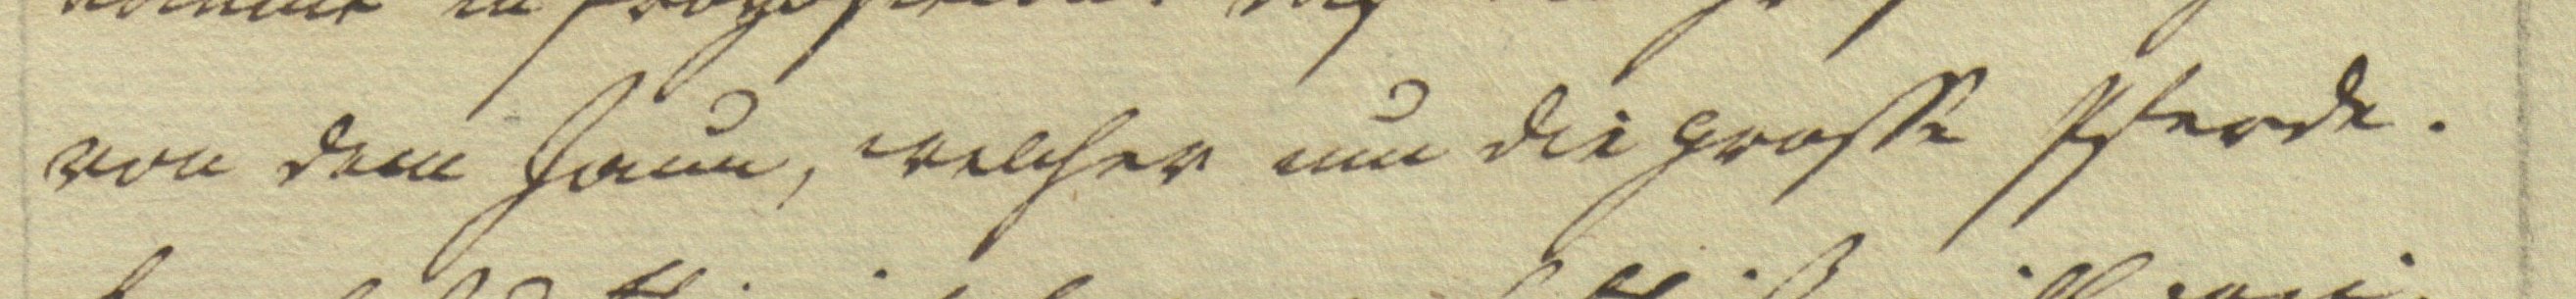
von dem Zaun, welcher um die grosse Pferde¬
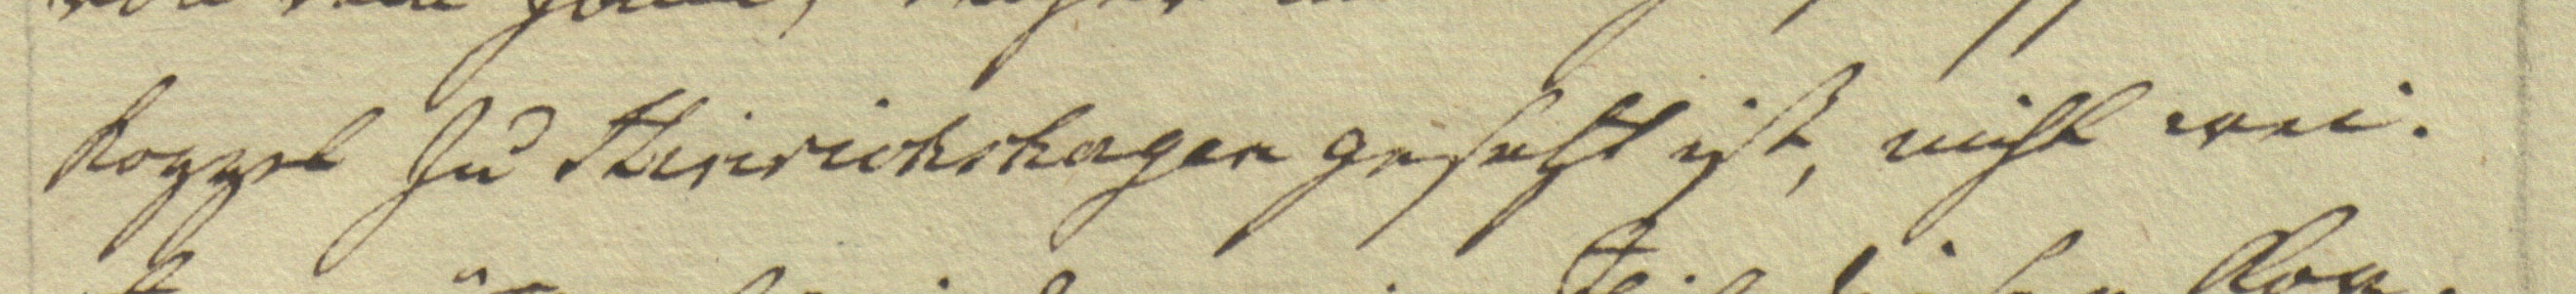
koppel zu Hinrichshagen gesetzt ist, nicht wei¬
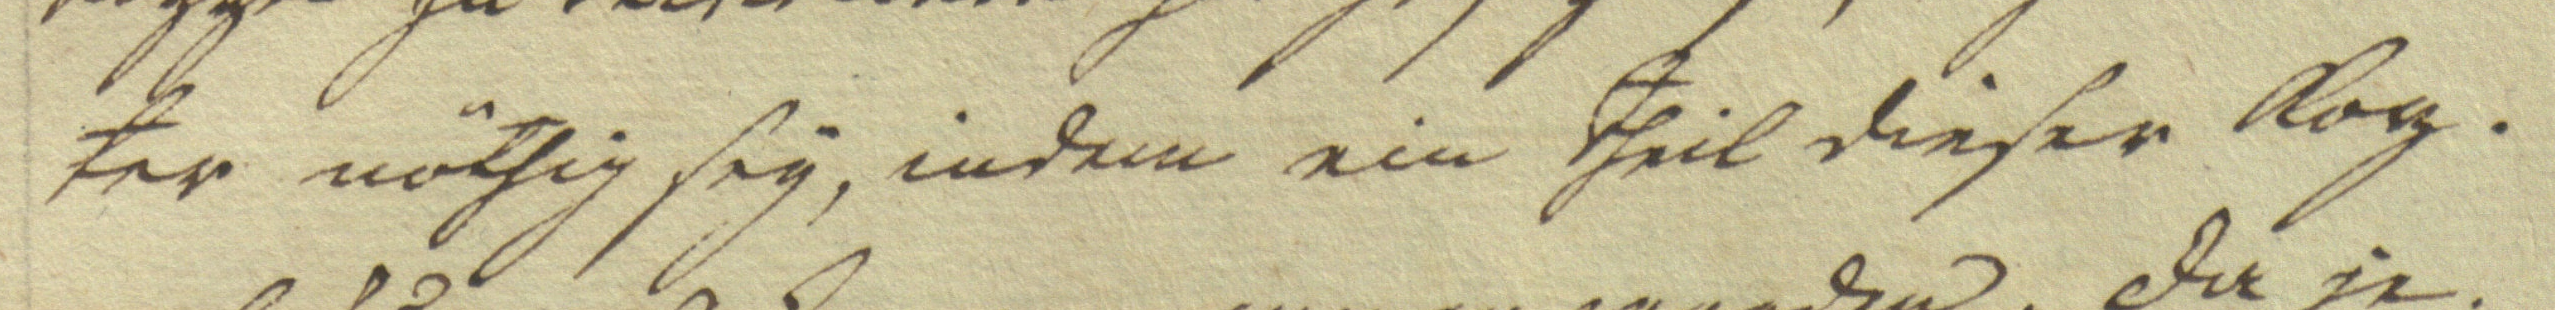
ter nöthig seÿ, indem ein Theil dieser Kop¬
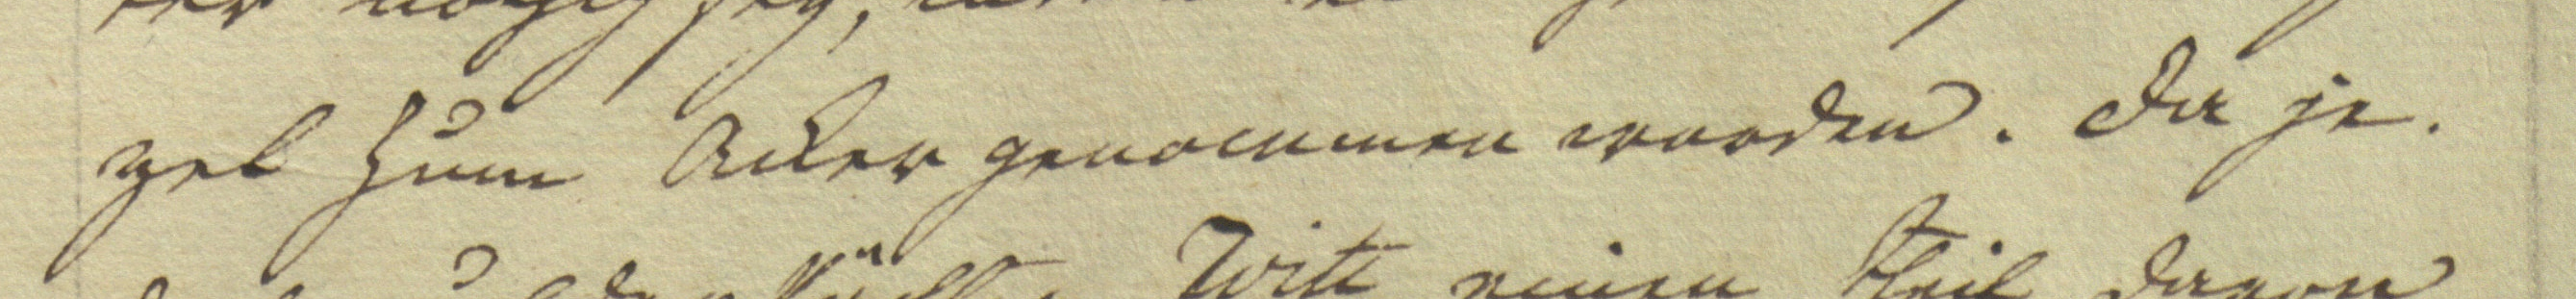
pel zum Acker genommen worden. Da je¬
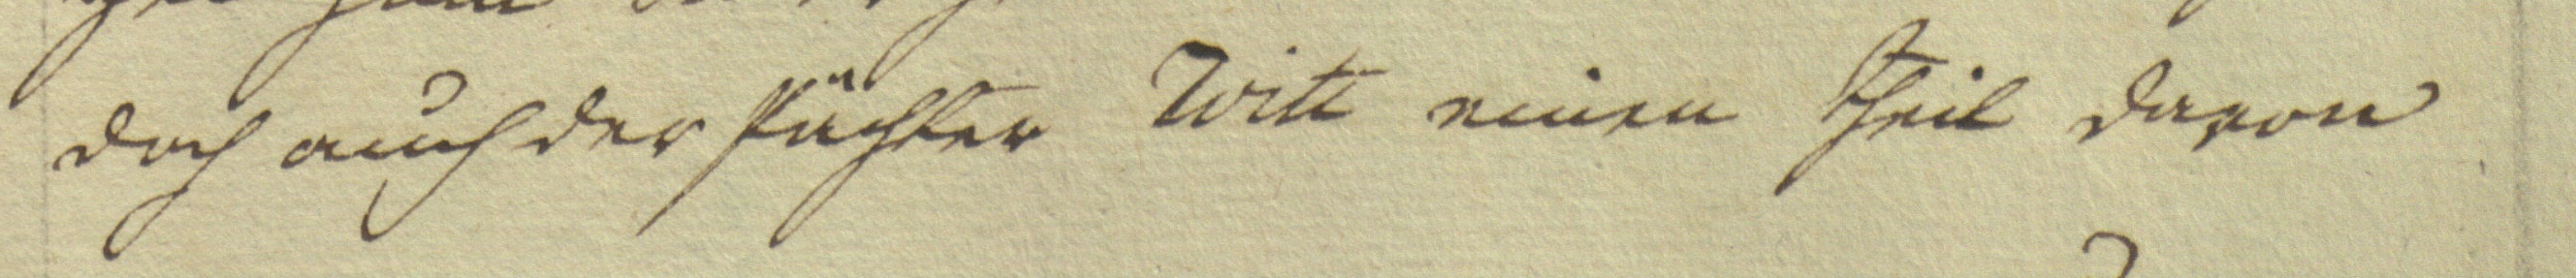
doch auch der Pächter Witt einen Theil davon
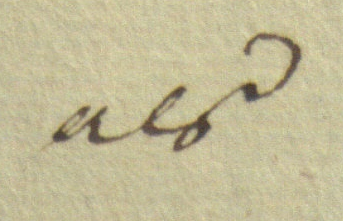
als
